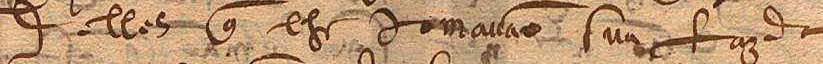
delles q̄ lhe tomauão sua fazda
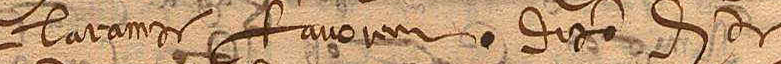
claramte fauorece o ditō drte
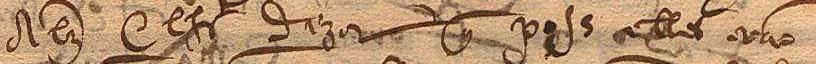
Al̄z e lhe dizer q̄ pojs elles erão
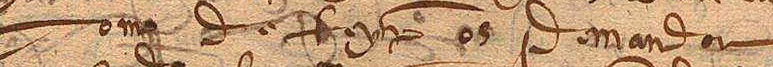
como de feyt̄o os demandou
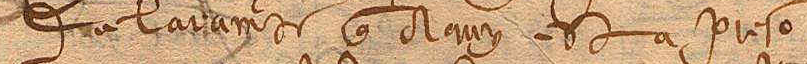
declaramte q̄ Aquy esta preso
